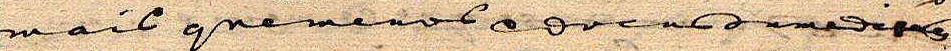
mais que menos e do custume dise q̄
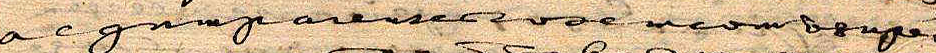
algum parentesco tem com ho supli
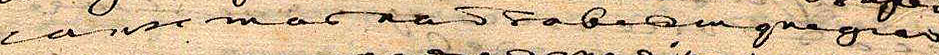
cante mas naõ sabe em que grao
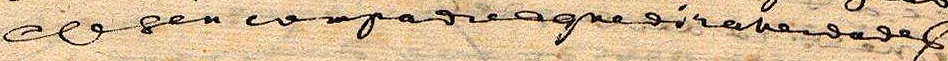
e he seu compadre e que dira verdade
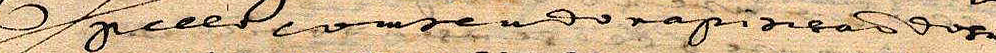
pello comteudo na pitisaõ do su
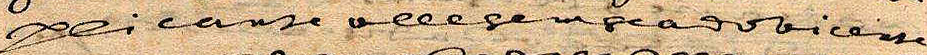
plicante o llesemseado vicente
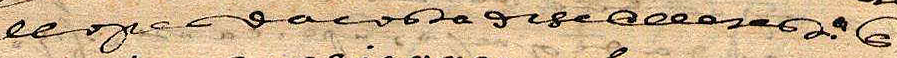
llopes da costa dise elle test.a q̄
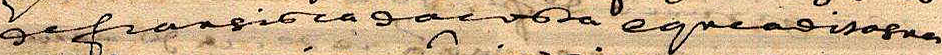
de fransisca da costa e que a dita sua
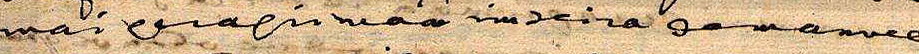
mai hera hirmaā imteira de manoel
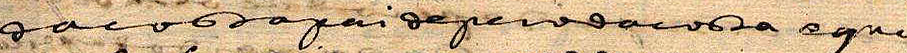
da costa pai de pero da costa e que
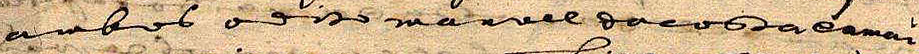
ambos o dito manoel da costa e a mai
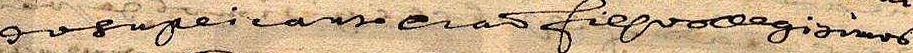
do suplicante eraõ filhos llegitimos
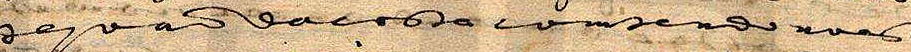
de joaõ da costa comteudo no es
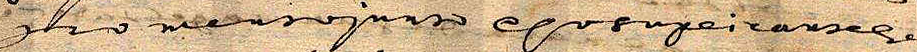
tromento junto e ho suplicante he
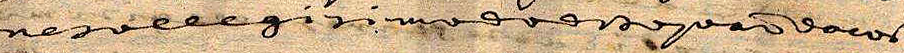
neto llegitimo do dito joaõ da cos
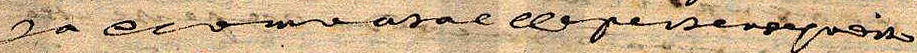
ta e como a tal lhe pertense ho dito
